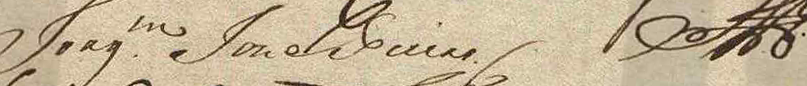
Joaq.m Ioze Guiao
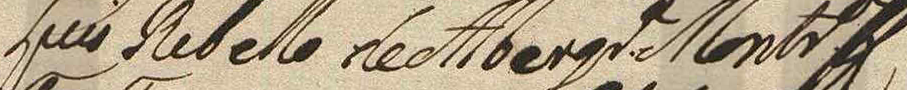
Luis Rebello de Albergr.a Montr.o
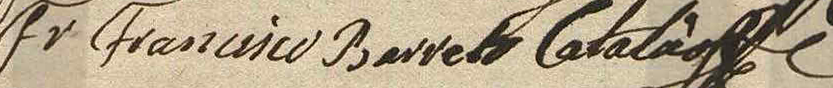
Fr Francisco Barreto Catalão
